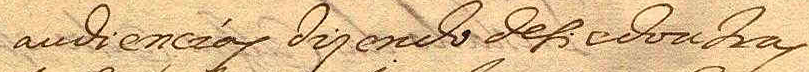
audiençias dizendo de si e doutras
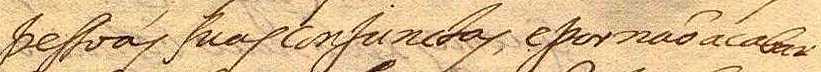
pessoas suas conJunctas, e por naõ acabar
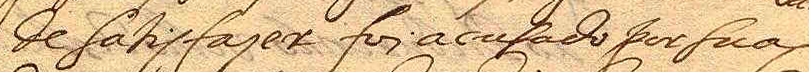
de satisfazer foi acusado por suas
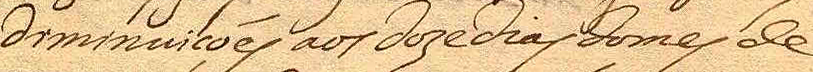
diminuiçoẽs aos doze dias do mes de
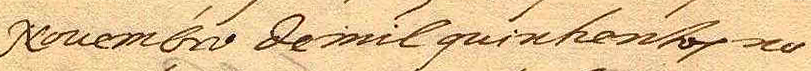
Nouembro de mil quinhentos no
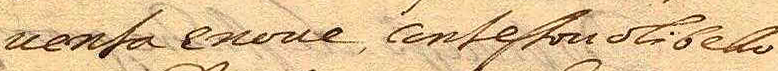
uenta e noue, contestou o libello
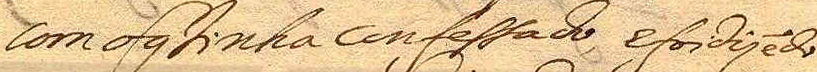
com o q̄ tinha confessado, e foi dizēdo
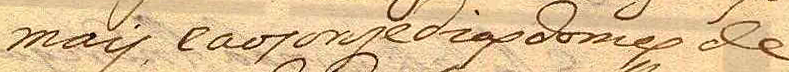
mais, e aos onze dias do mes de
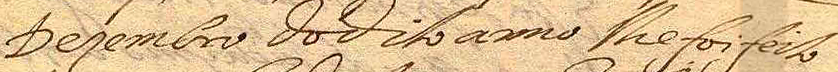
Dezembro do dito anno lhe foi feito
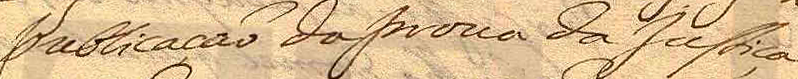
publicaçaõ da proua da Justiça
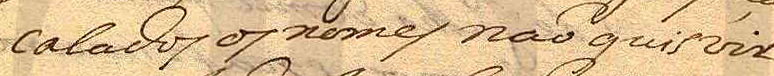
calados os nomes naõ quis vir
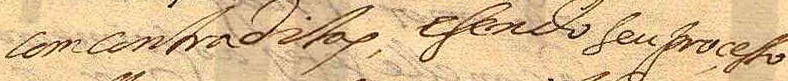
com contraditas, e sendo seu proçesso
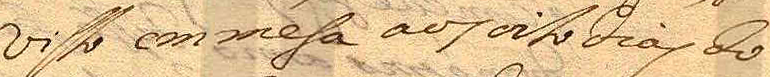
visto em mesa aos oito dias do
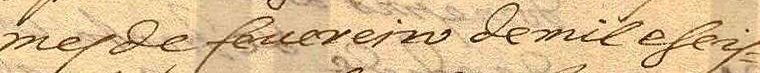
mes de feuereiro de mil e seis
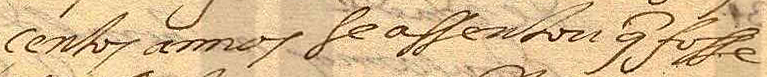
çentos annos se assentou q̄ fosse
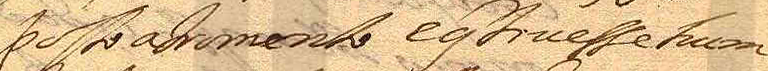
posto a tromento e q̄ tivesse hum
